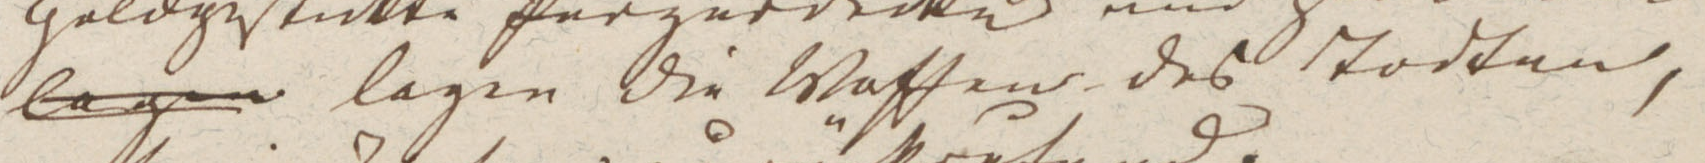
lagen lagen die Waffen des Todten,
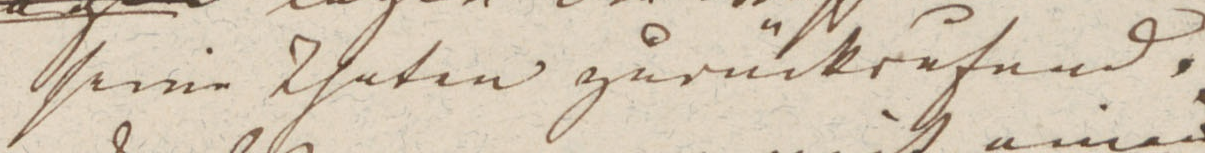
seine Thaten zurückrufend.
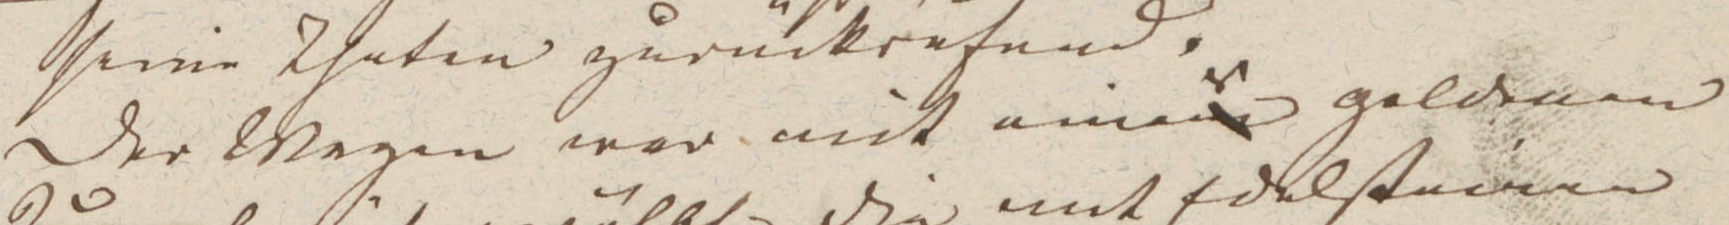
Der Wagen war mit einemr goldenen
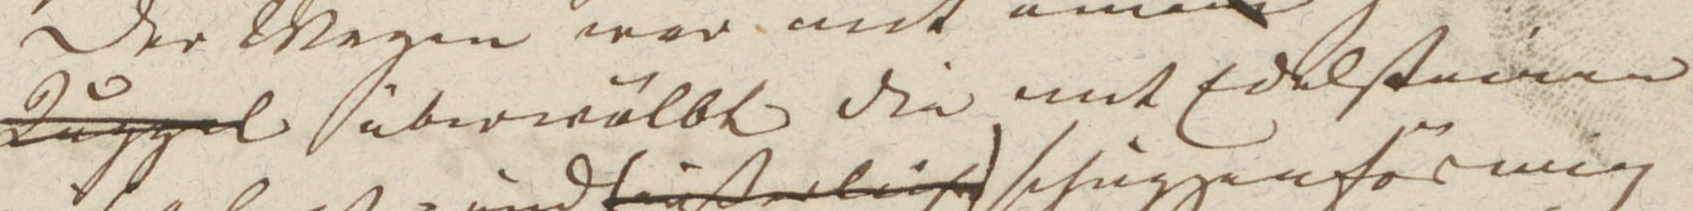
Kuppel überwölbt die mit Edelsteinen
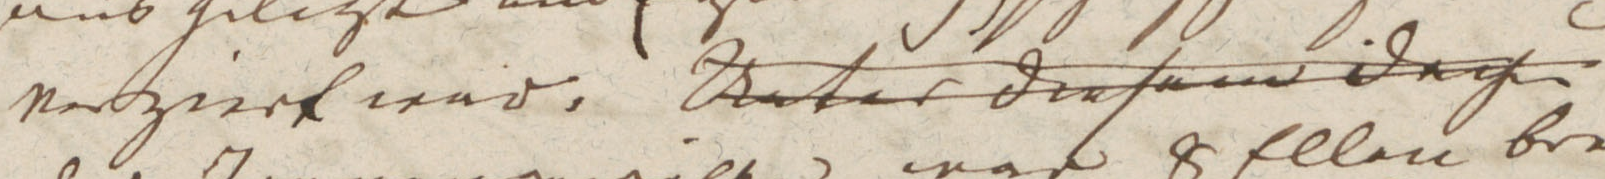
verziert war. Unter diesem Dach
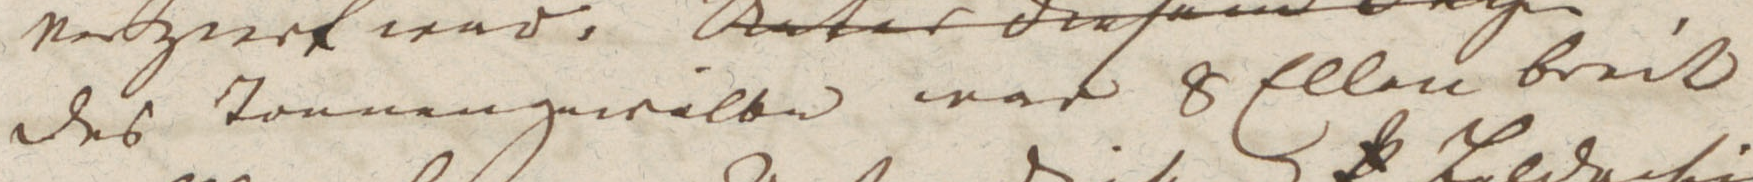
Das Tonnengewölbe war 8 Ellen breit
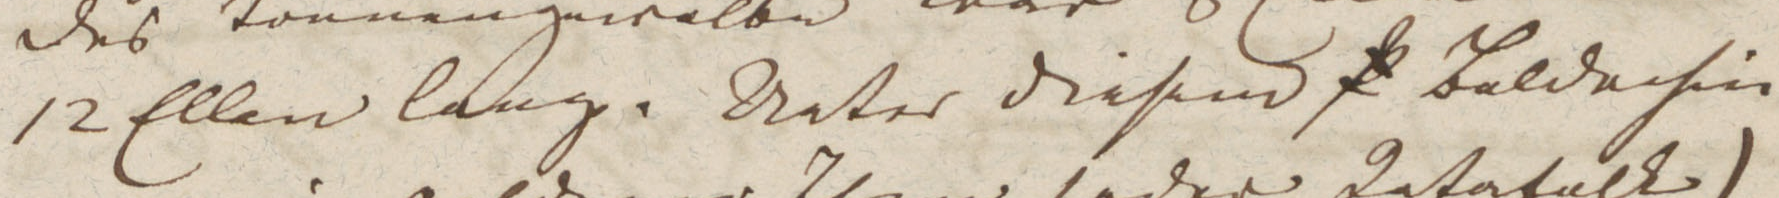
12 Ellen lang. Unter diesem P Baldachin
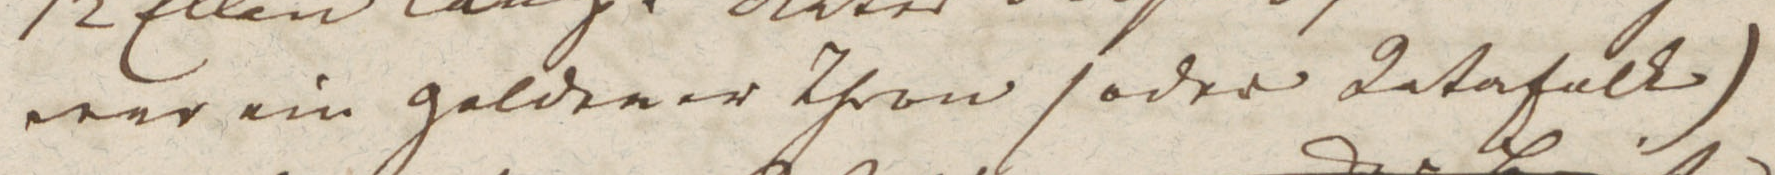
war ein goldener Thron (oder Katafalk)
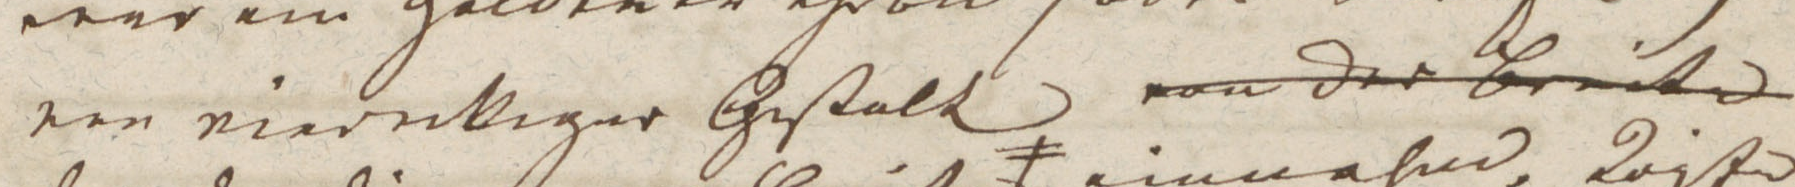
von viereckiger Gestalt von der Breite
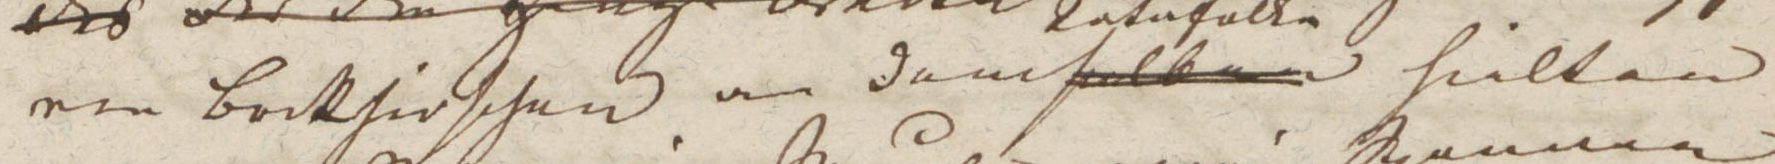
von Bockhirschen an demselben Katafalke hielten
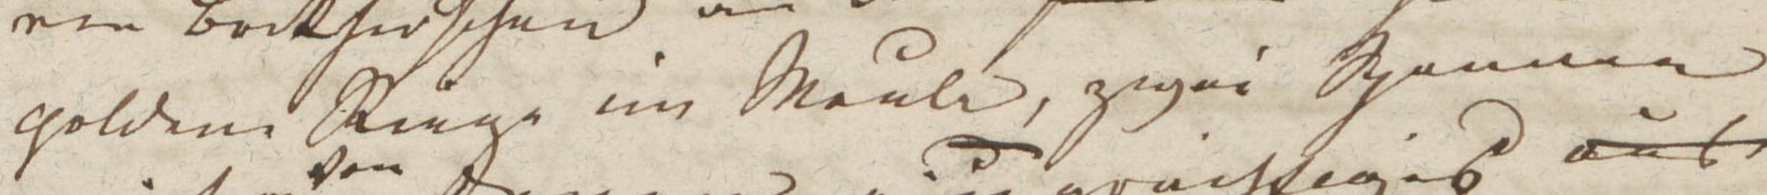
goldene Ringe im Maule, zwei Spannen
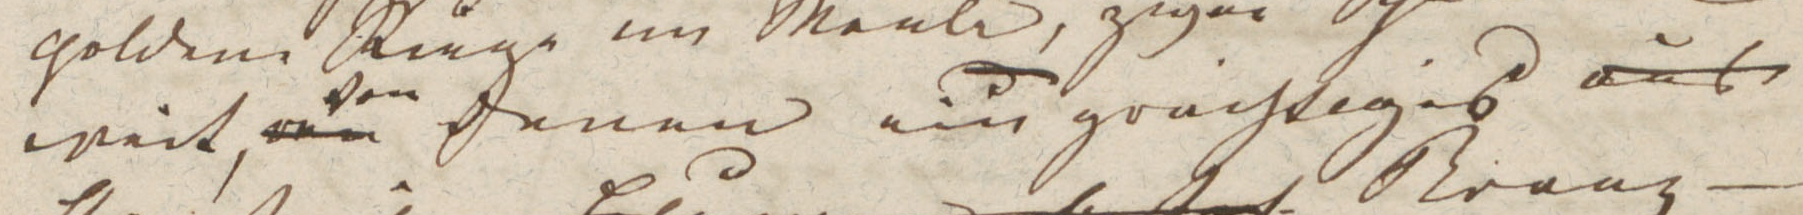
weit, von denen e prächtiges aus
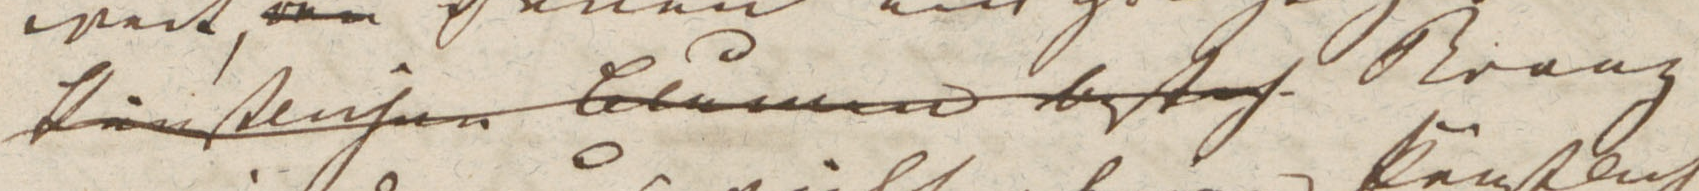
künstlichen Blumen besteh Kranz-
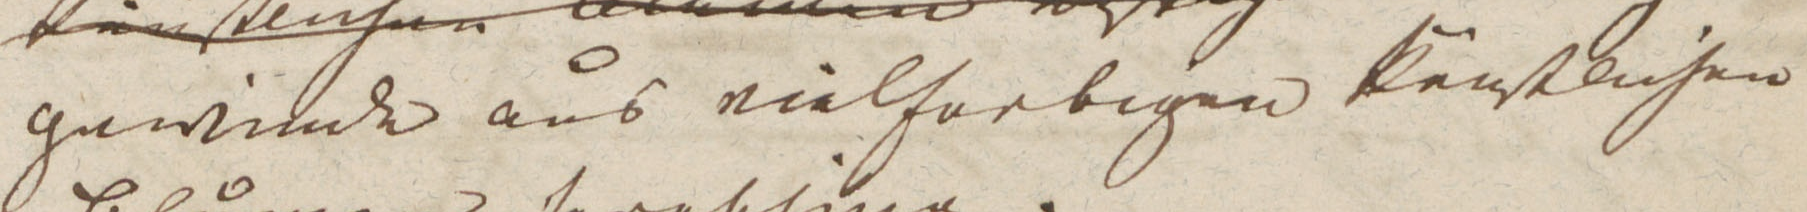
gewinde aus vielfarbigen künstlichen
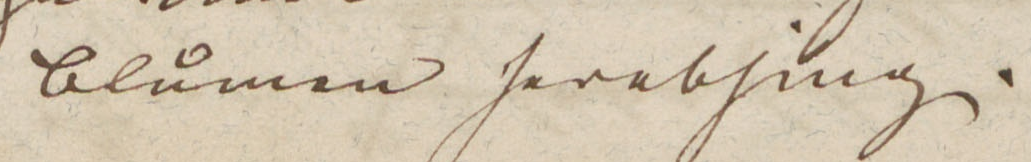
Blumen herabhing.
